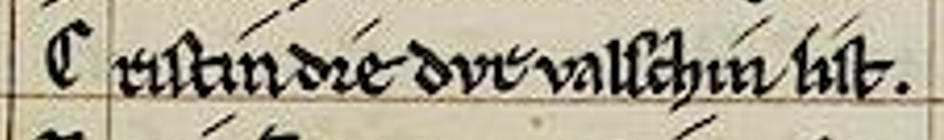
Criſtin die dvr valſchin liſt.
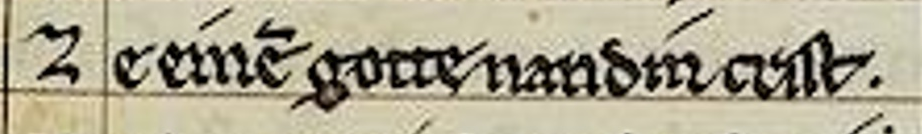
Ze eine(m) gotte nandin criſt.
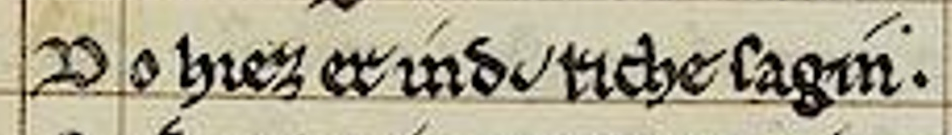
Do hiez er ind(az) riche ſagin.
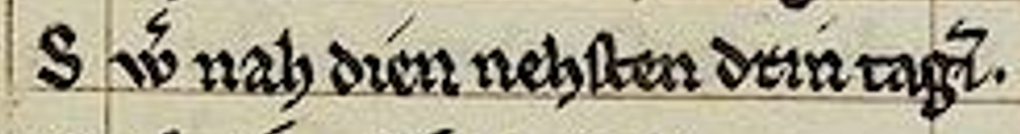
Sw(er) nah dien nehſten drin tagi(n).
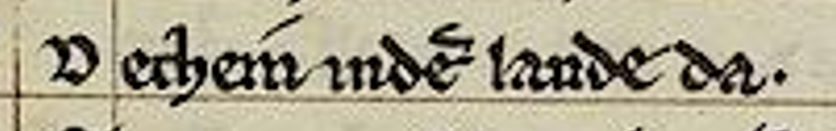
Dechein inde(m) lande da.
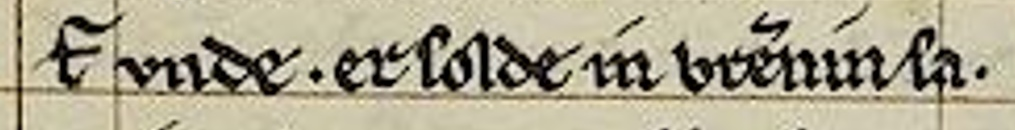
Fvnde. er ſolde in bre(n)nin ſa.
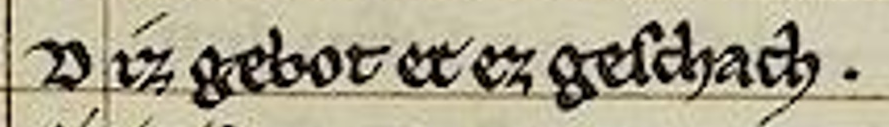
Diz gebot er ez geſchach.
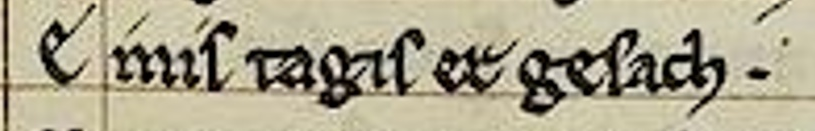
Einiſ tagiſ er geſach.
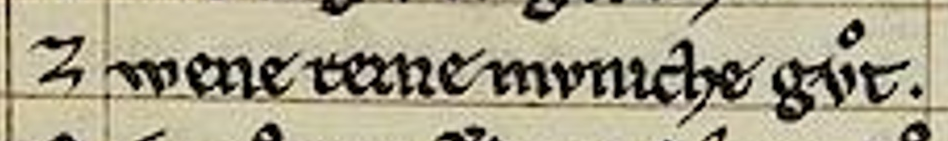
Zwene reine mvniche gv°ot.
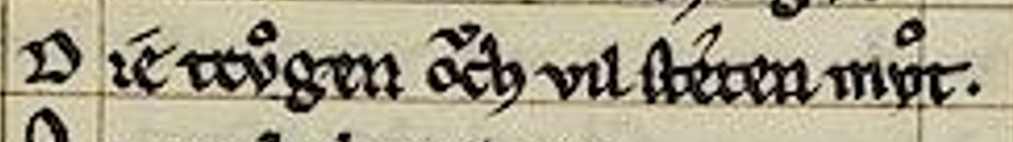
Die trv°ogen o°vch vil ſteten mv°ot.
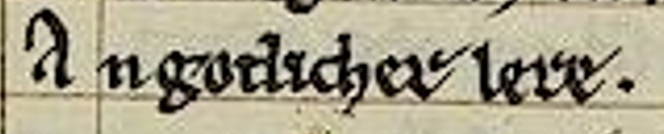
An gotlicher lere.
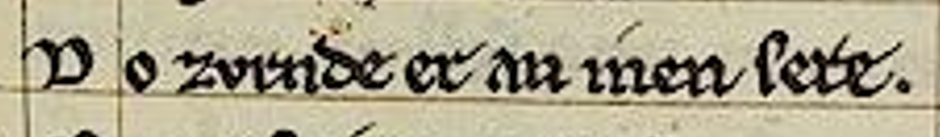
Do zvrnde er an inen ſere.
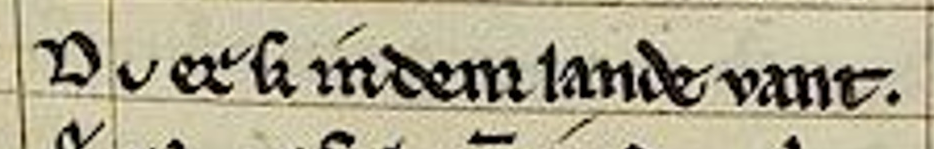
D(az) er ſi in dem lande vant.
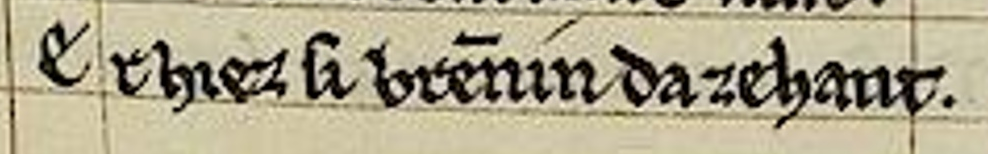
Er hiez ſi bre(n)nin da zehant.
